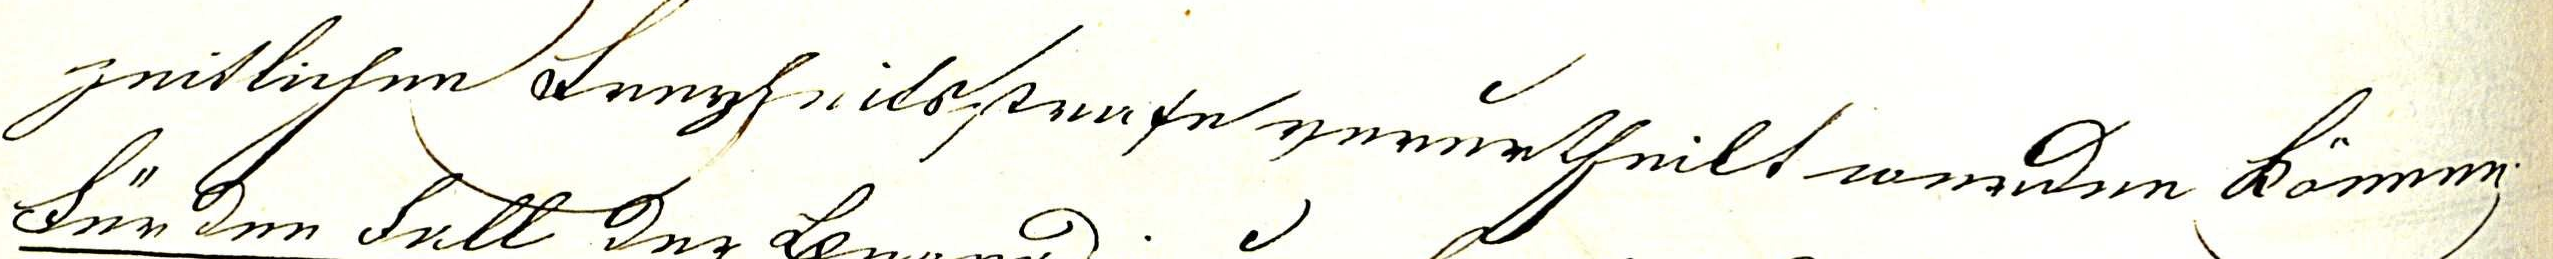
zeitlichen Freyheitsstrafe verurtheilt werden können.
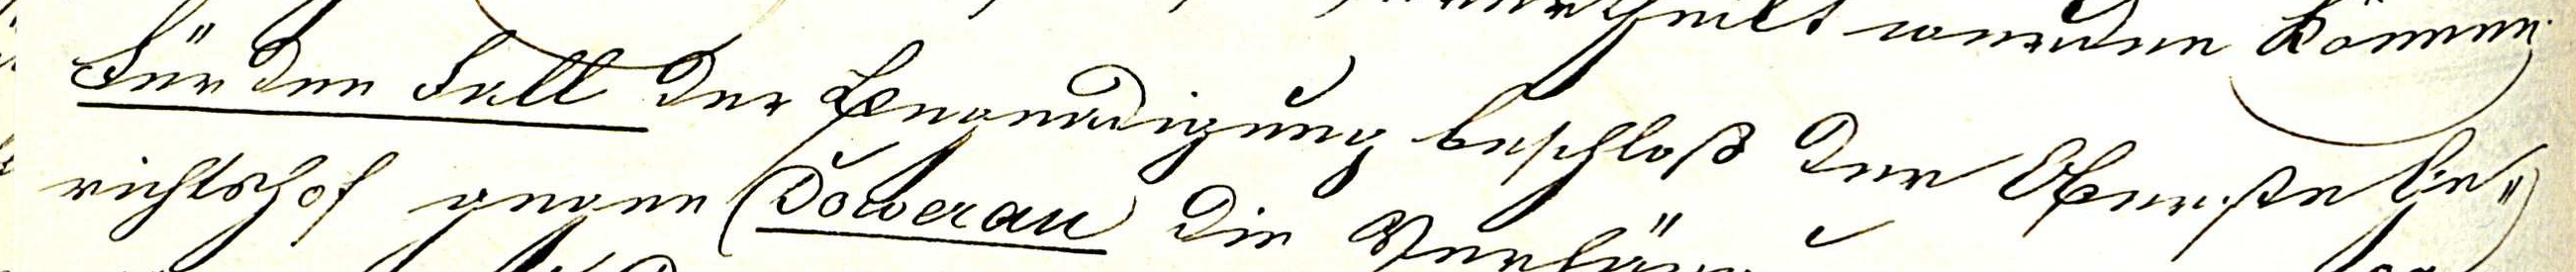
Für den Fall der Begnadigung beschloß der Oberste Ge¬
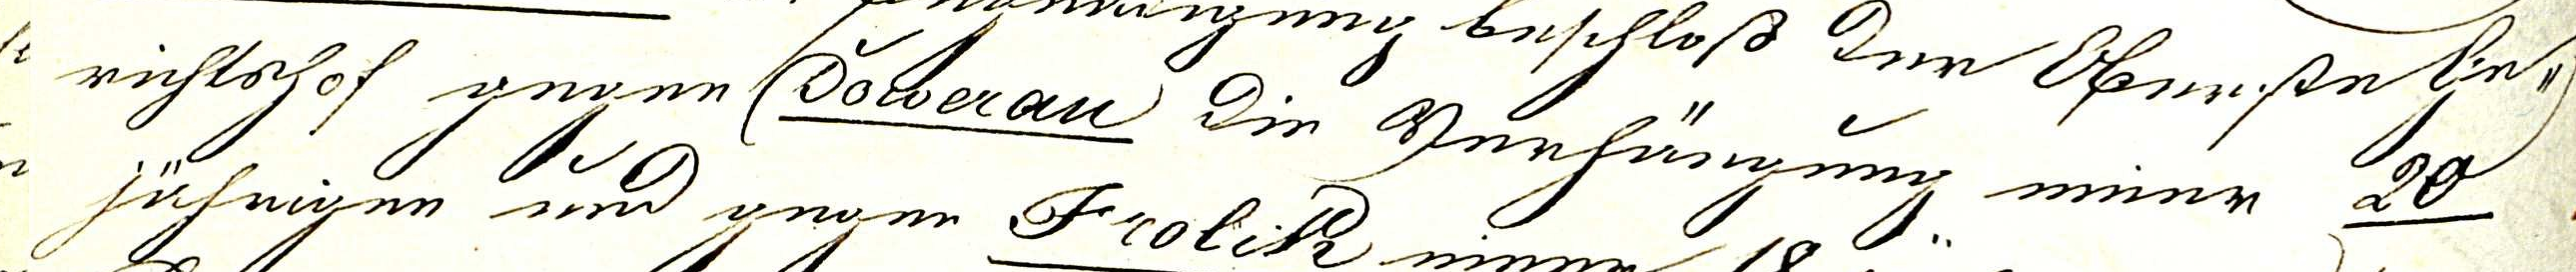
richtshof gegen Dowerau die Verhängung einer 20
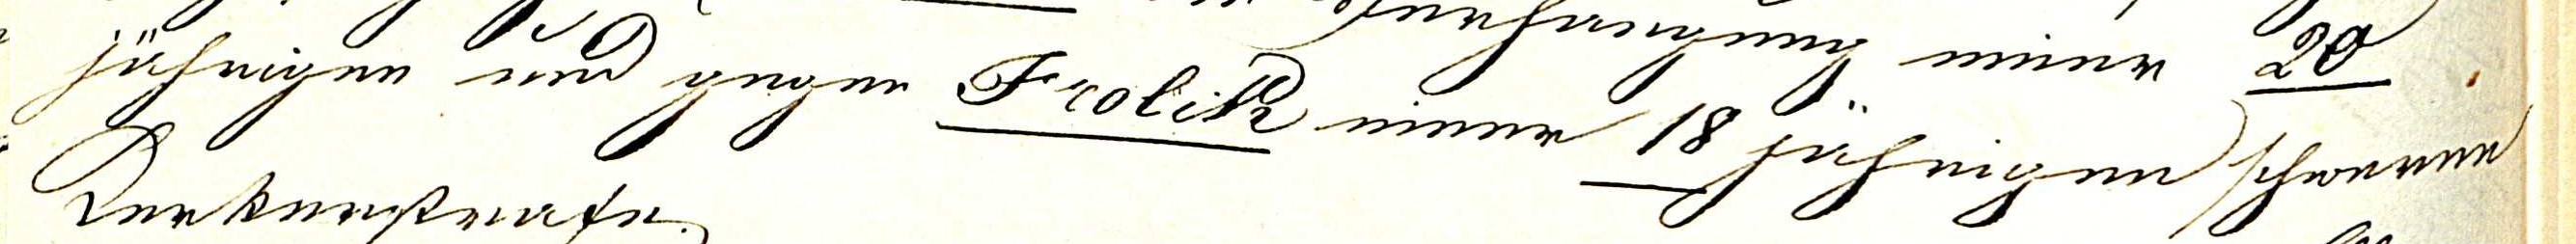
jährigen und gegen Frolik einer 18jährigen schweren
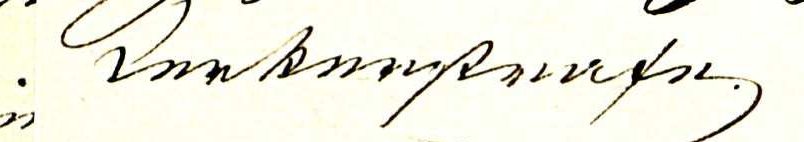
Kerkerstrafe.
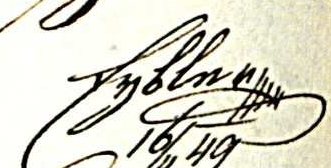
Eybler
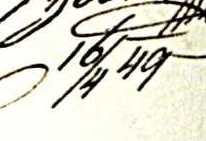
16/4 49
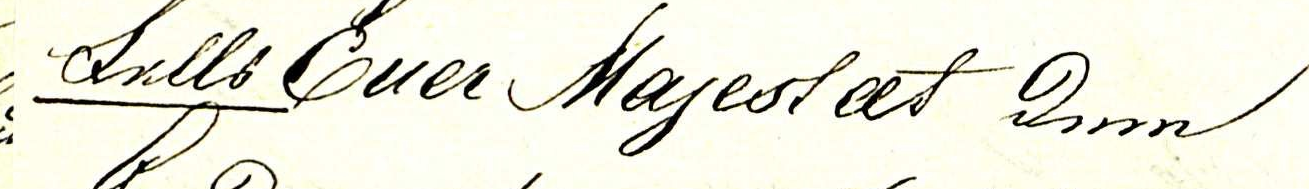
Falls Euer Majestaet den
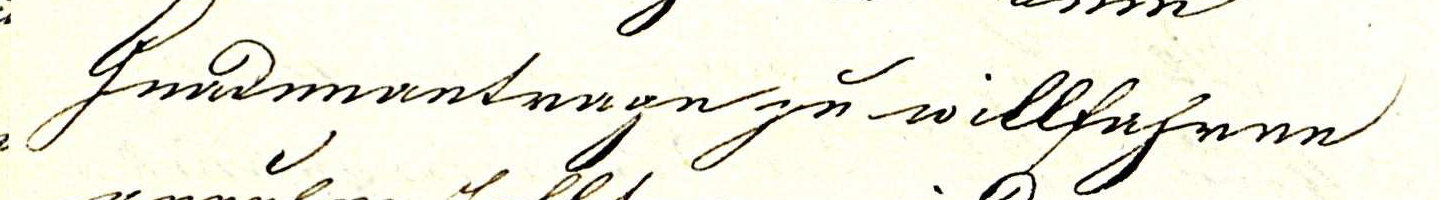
Gnadenantrage zu willfahren
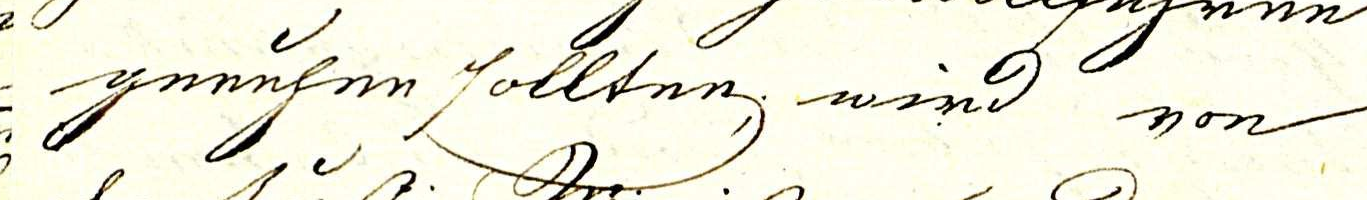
geruhen sollten, wird von
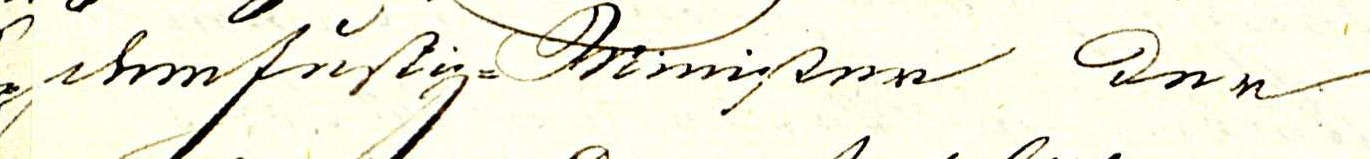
dem Justiz-Minister der
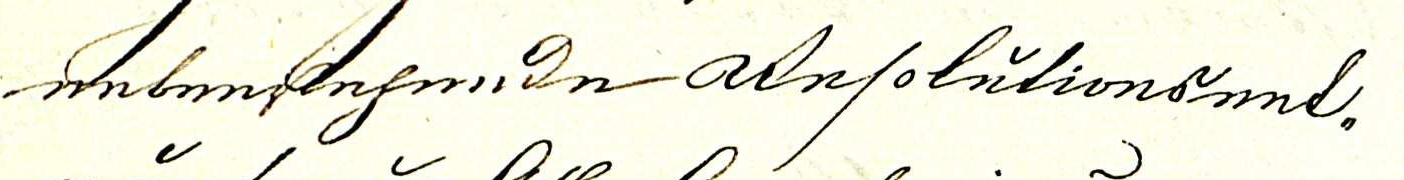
nebenstehende Resolutionsent¬
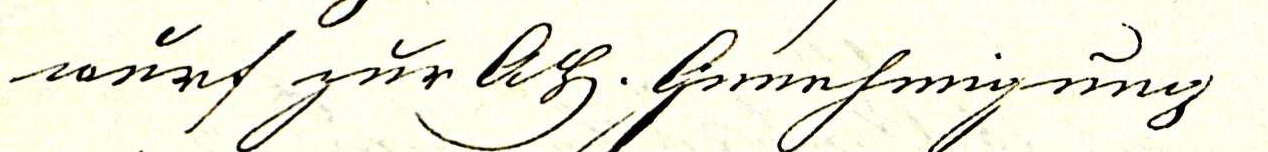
wurf zur Ah. Genehmigung
